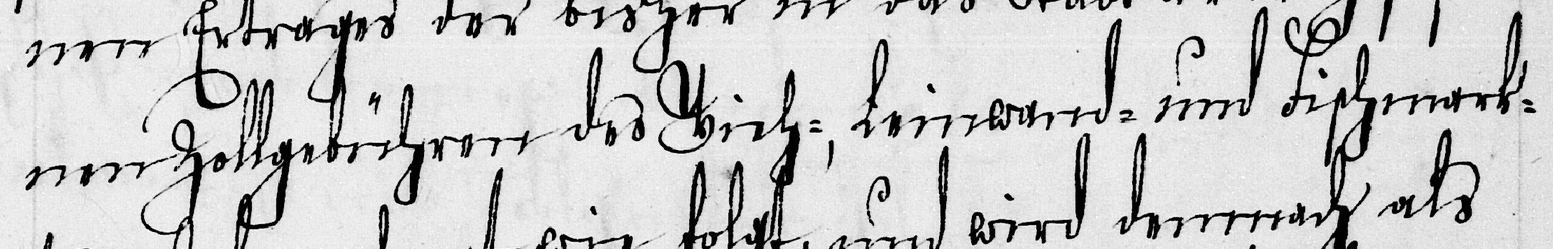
nen Zollgebühren, des Vieh-, Leinwand- und Fischmark¬
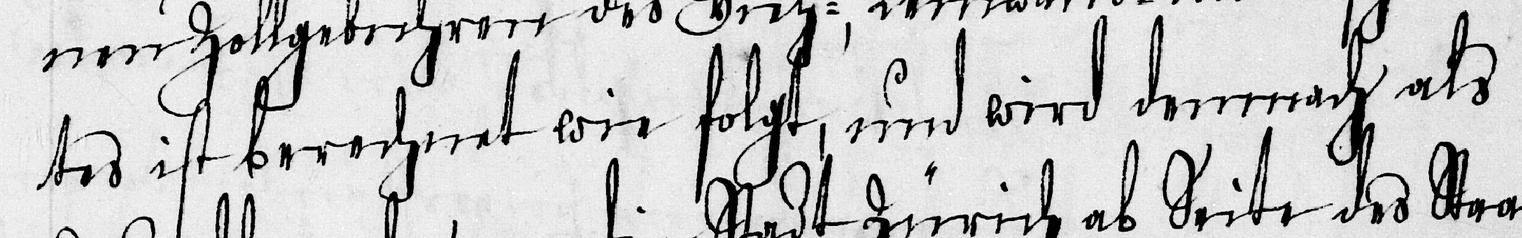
tes ist berechnet wie folgt, und wird demnach als
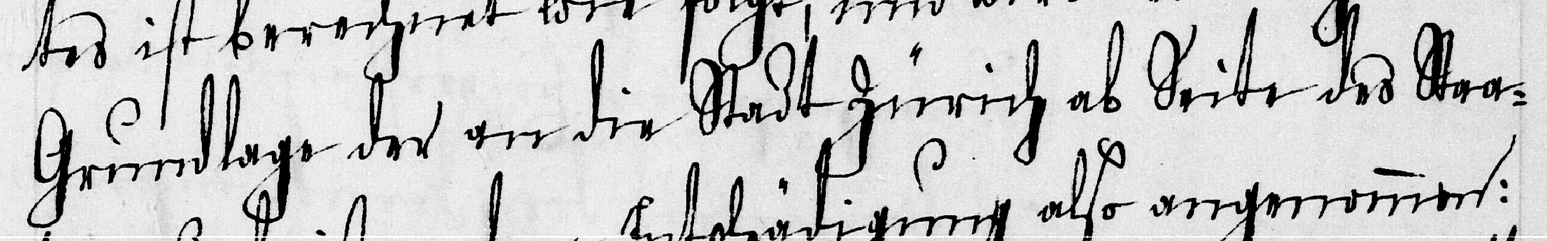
Grundlage der an die Stadt Zürich ab Seite des Staa¬
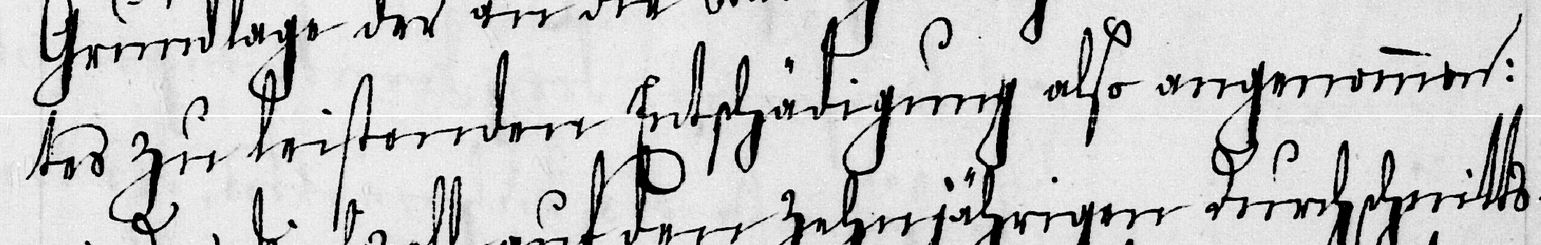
tes zu leistenden Entschädigung also angenommen:
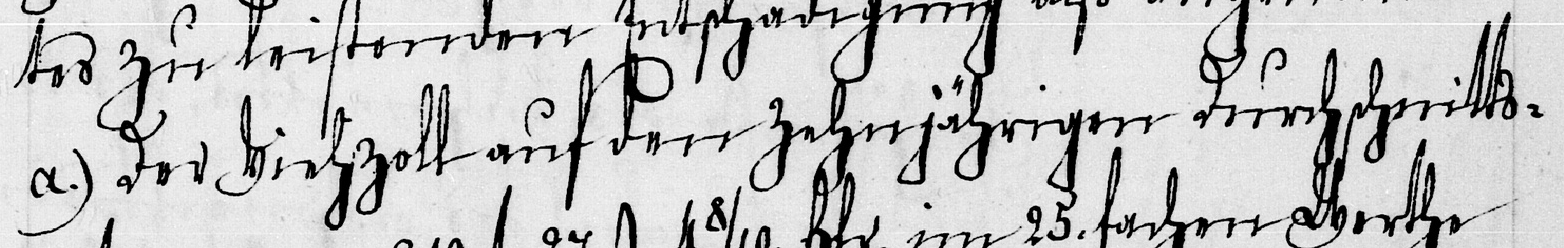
a.) Der Viehzoll auf den zehnjährigen Durchschnitts¬
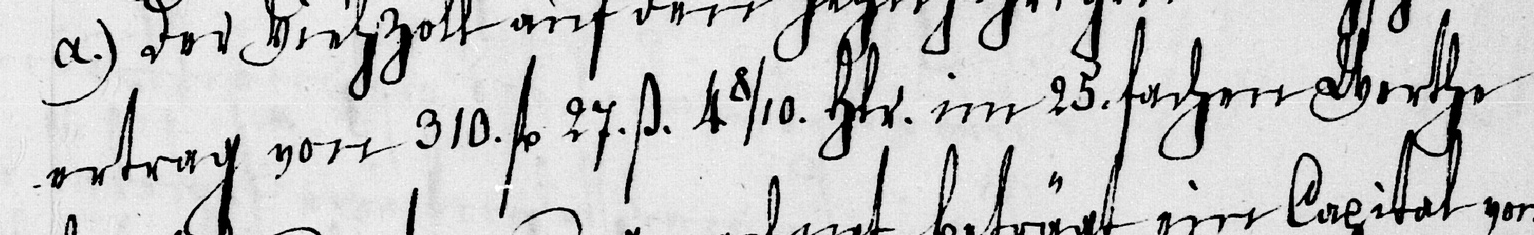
ertrag von 310. fl. 27. ß. 4 8/10. Hlr. im 25.fachen Werthe
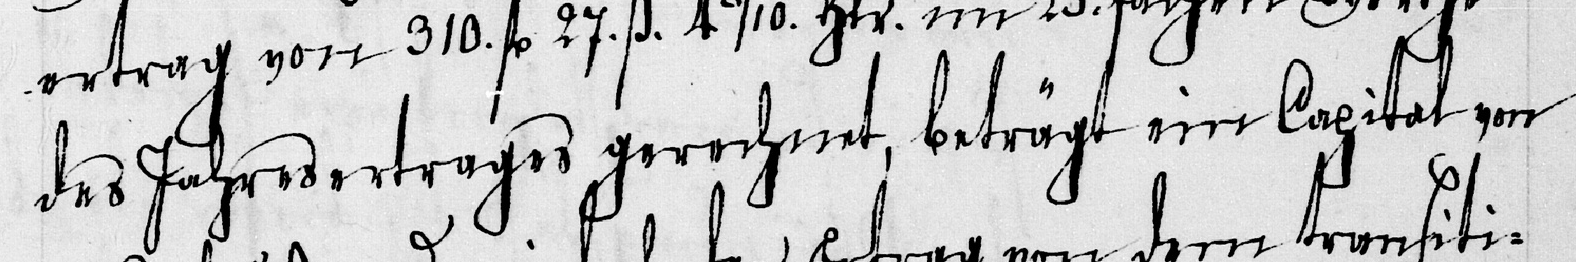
des Jahresertrages gerechnet, beträgt ein Capital von
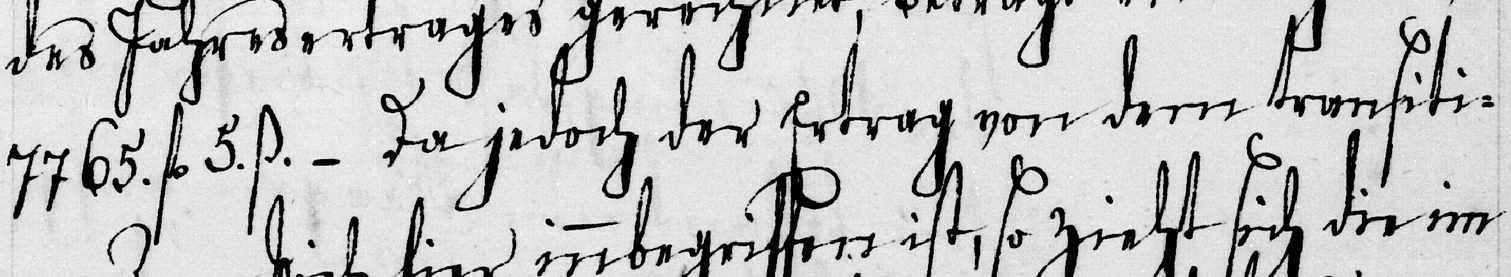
7765. fl. 5. ß. – Da jedoch der Ertrag von dem transiti¬
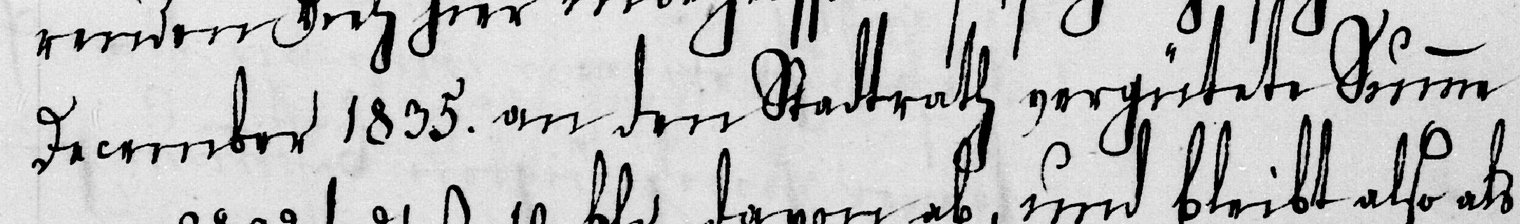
December 1835. an den Stadtrath vergütete Summe
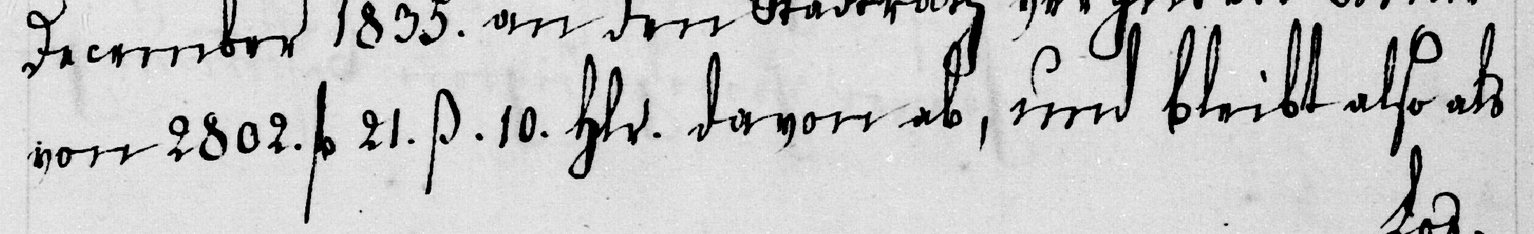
von 2802. fl. 21. ß. 10. Hlr. davon ab, und bleibt also als
